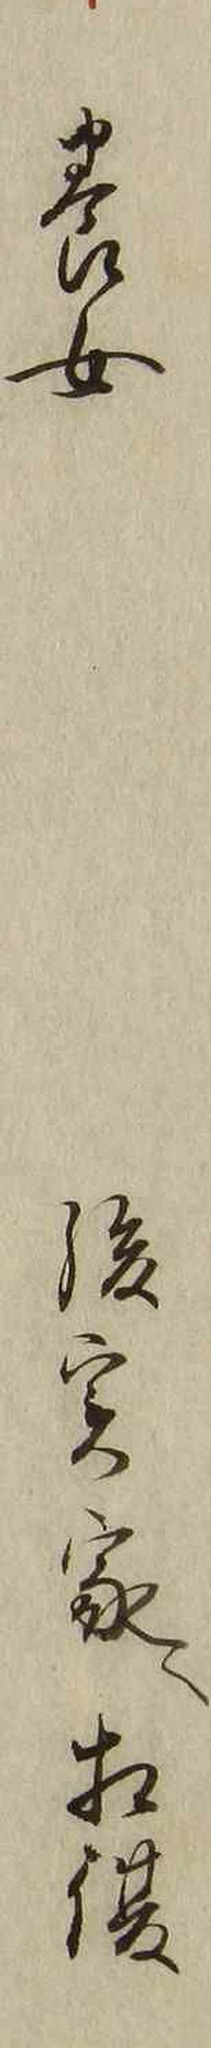養女後実家へ相復
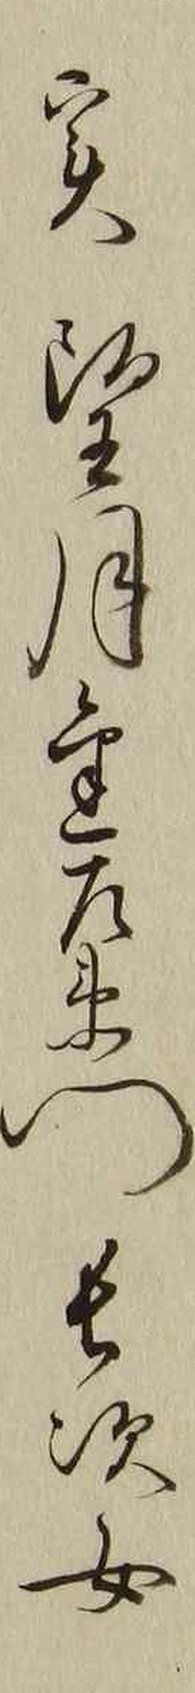実望月重左衛門長次女
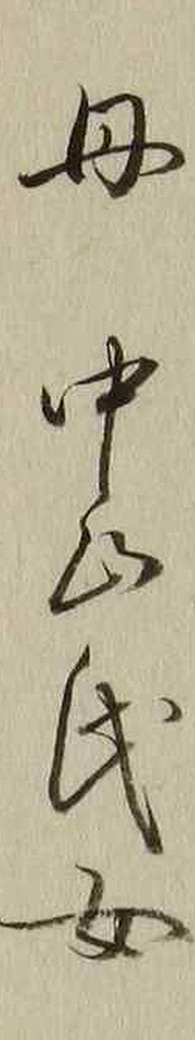母中山氏女
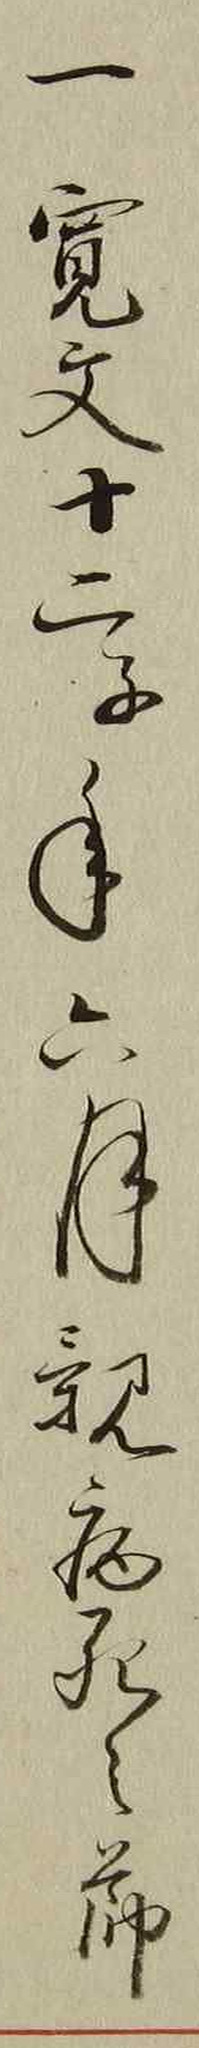一寛文十二子年六月親病死之節
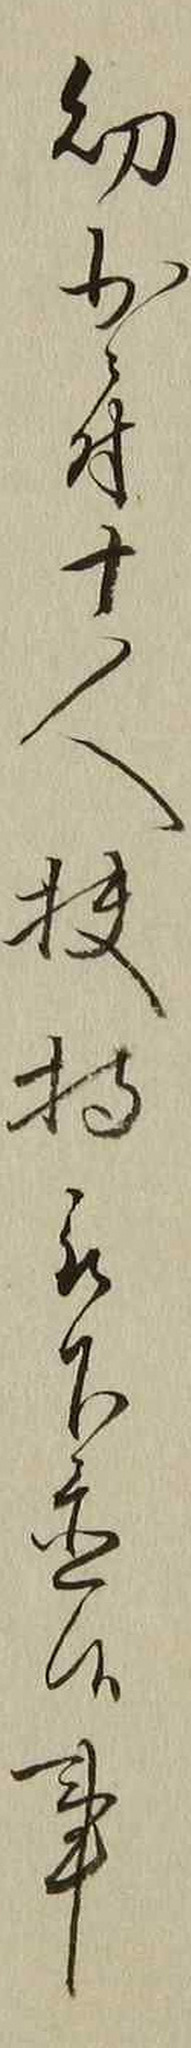幼少ニ付十人扶持被下置候事
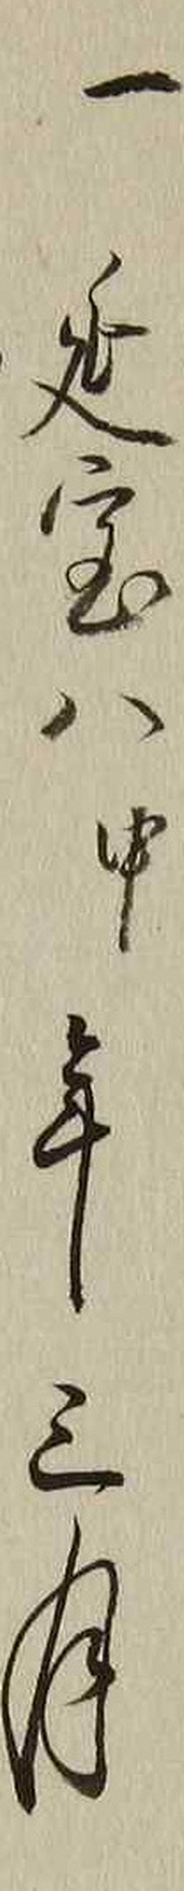一延宝八申年三月
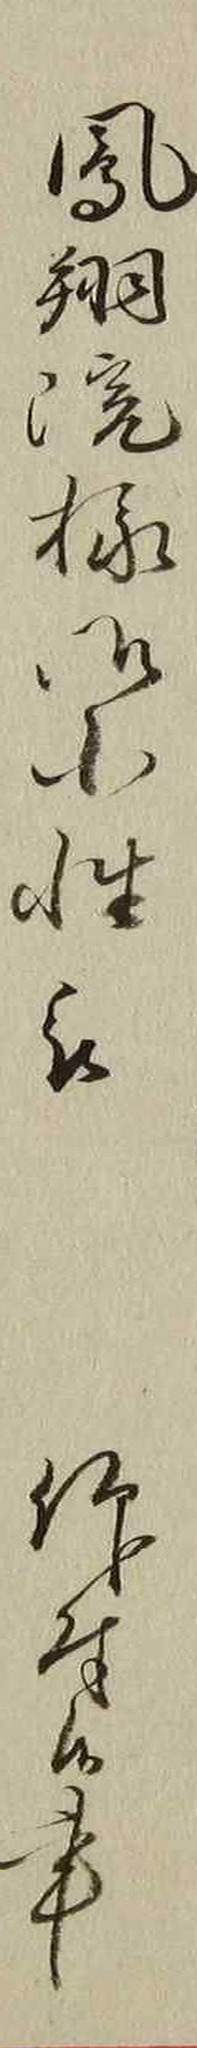鳳翔院様御小性被仰付候事
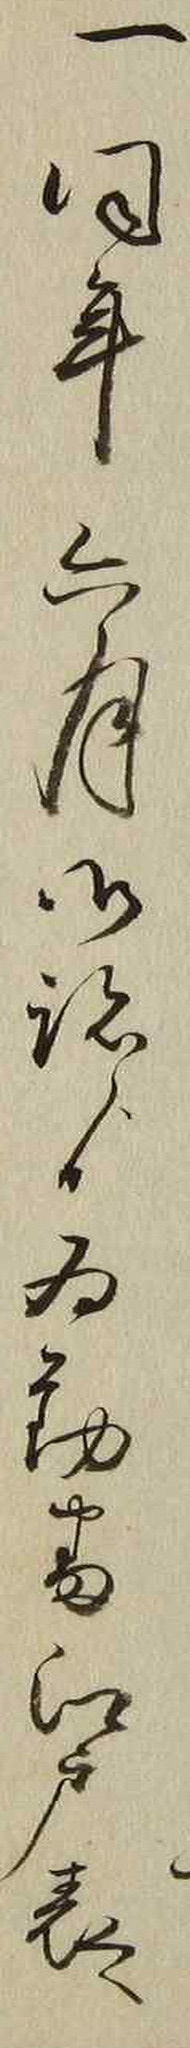一同年六月御跡ゟ為勤番江戸表へ
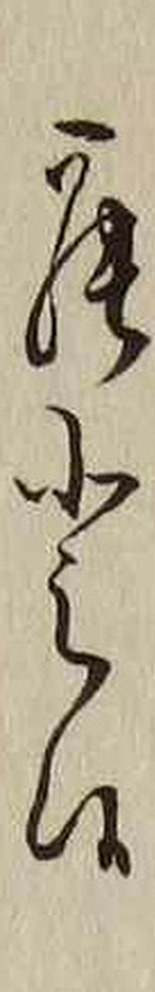罷登候
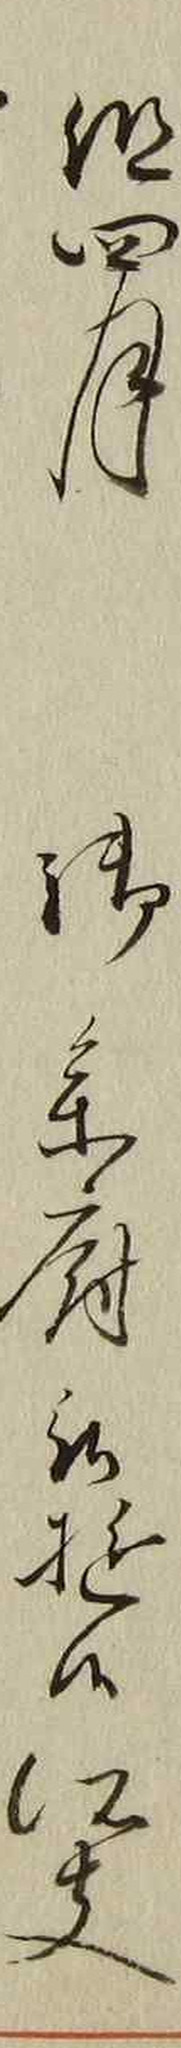但四月御参府被遊候所支
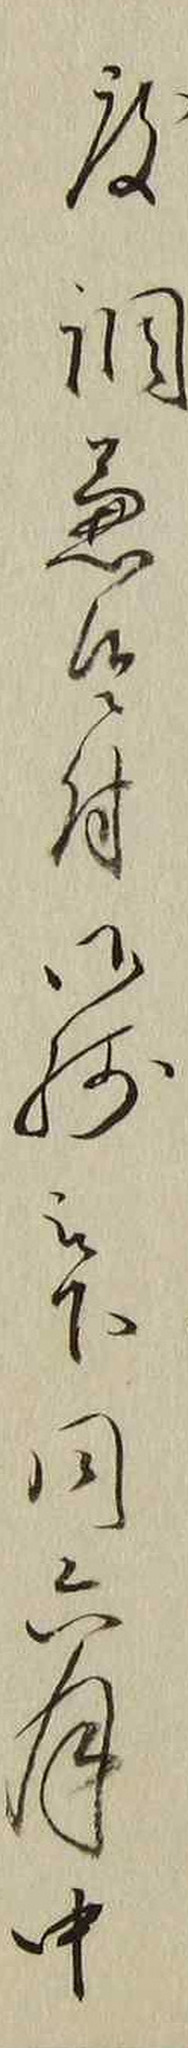度調兼候ニ付御残被下同六月中
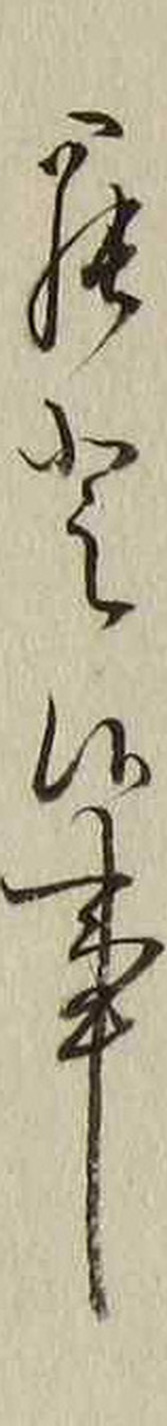罷登候事
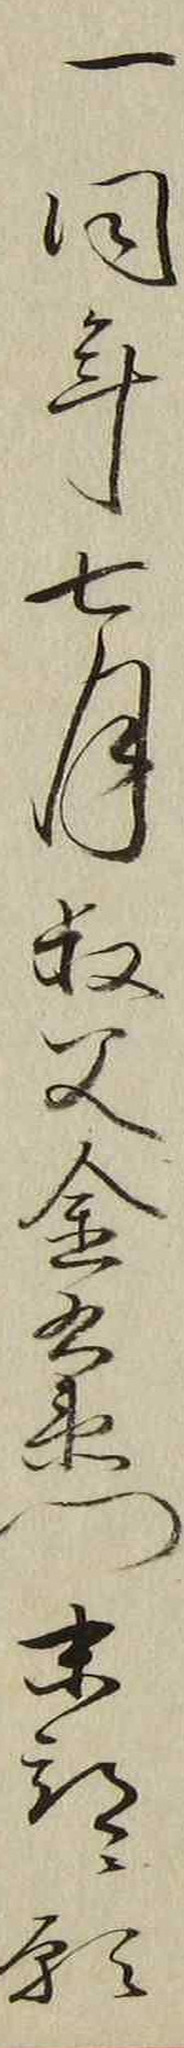一同年七月叔父金右衛門末期ニ願
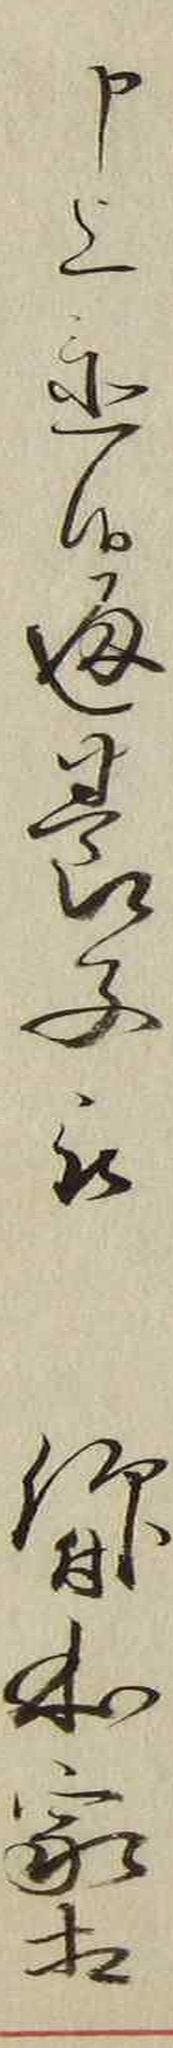申上置候通養子被仰付本家相

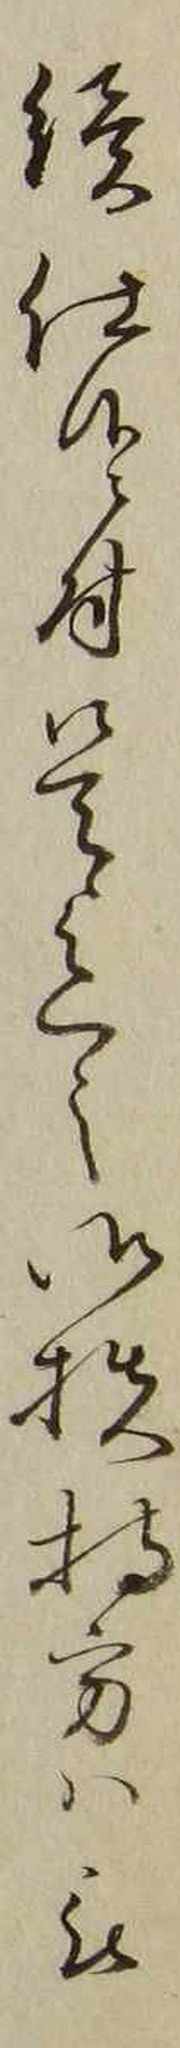続仕候ニ付是迄之御扶持方ハ被
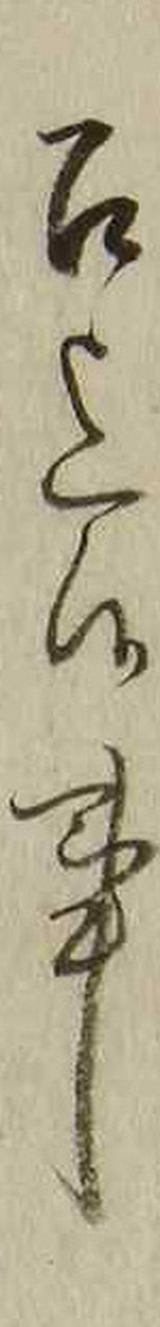召上候事
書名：諸士系譜　巻之2　い之部2
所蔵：会津若松市立会津図書館
